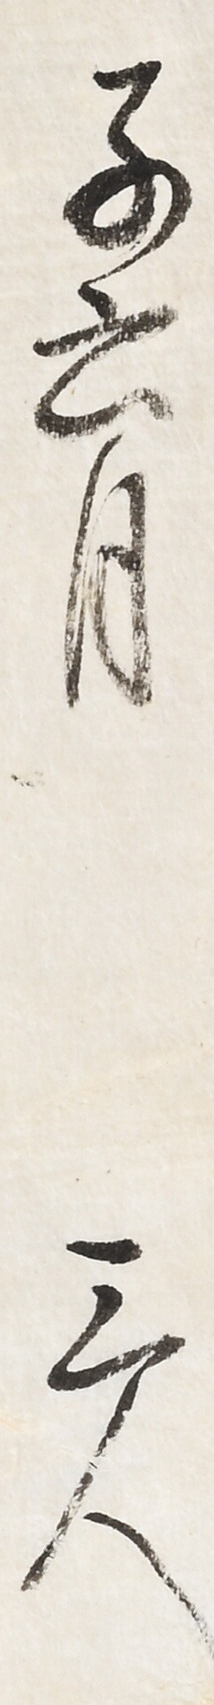子六月三人
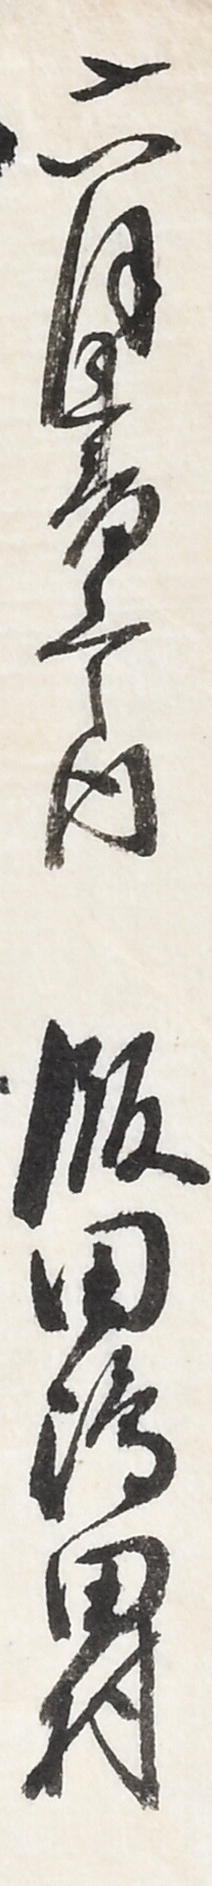六月書上之内飯田嶋田村
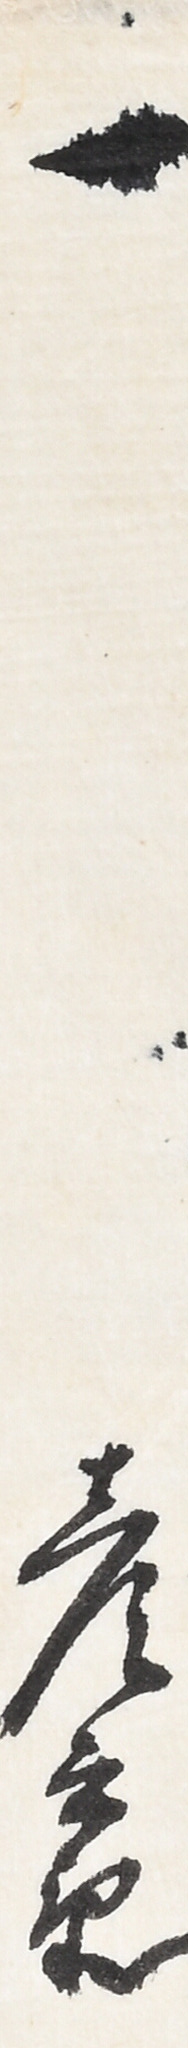一彦兵衛
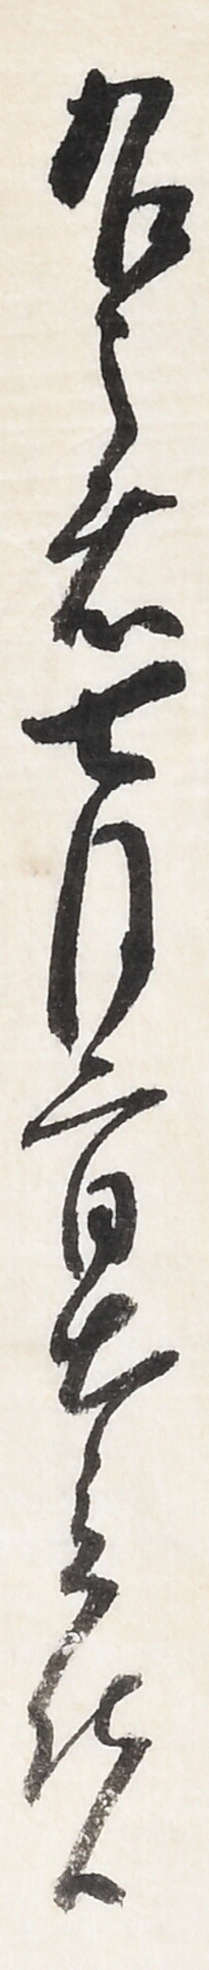右之者七月二日出立仕候
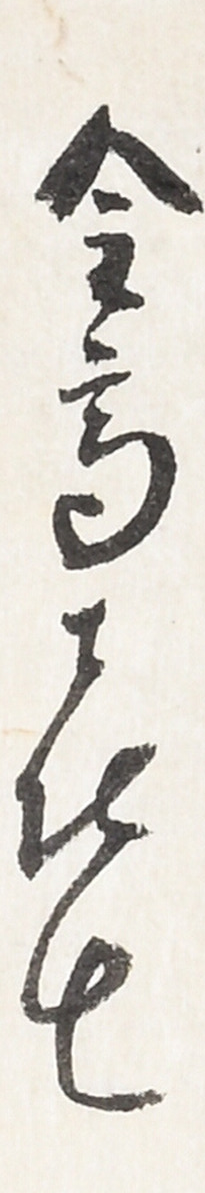一金高喜七
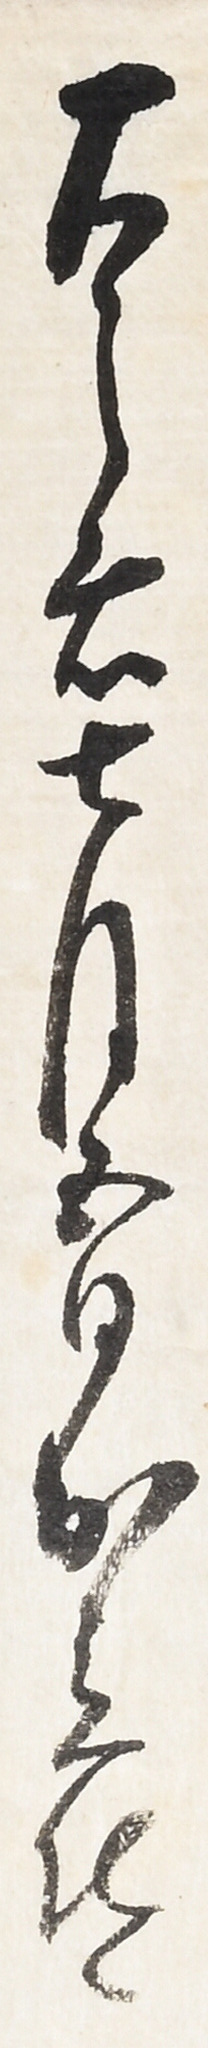右之者七月五日出立仕候
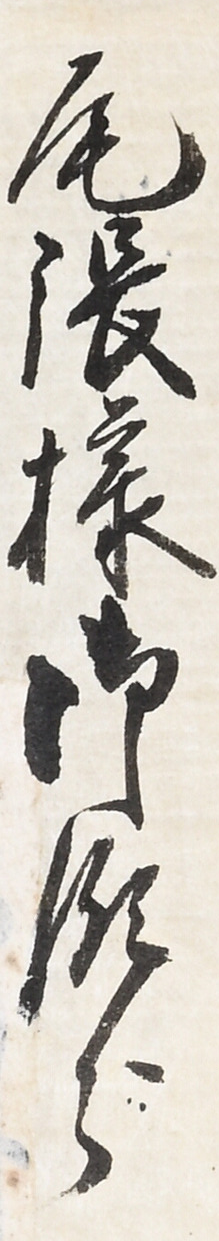尾張様御領分
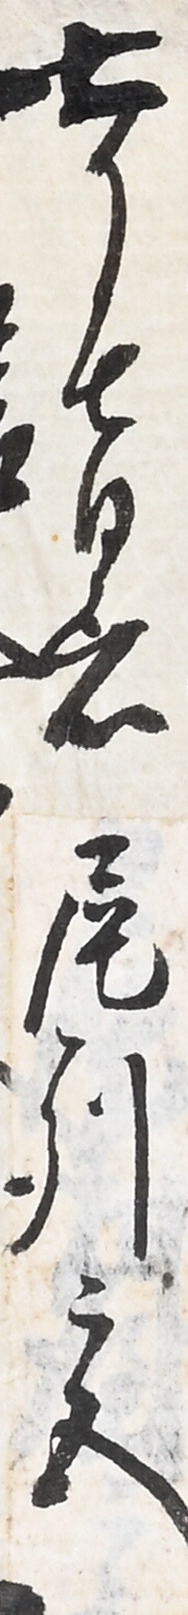七月七日嫡尾州宮
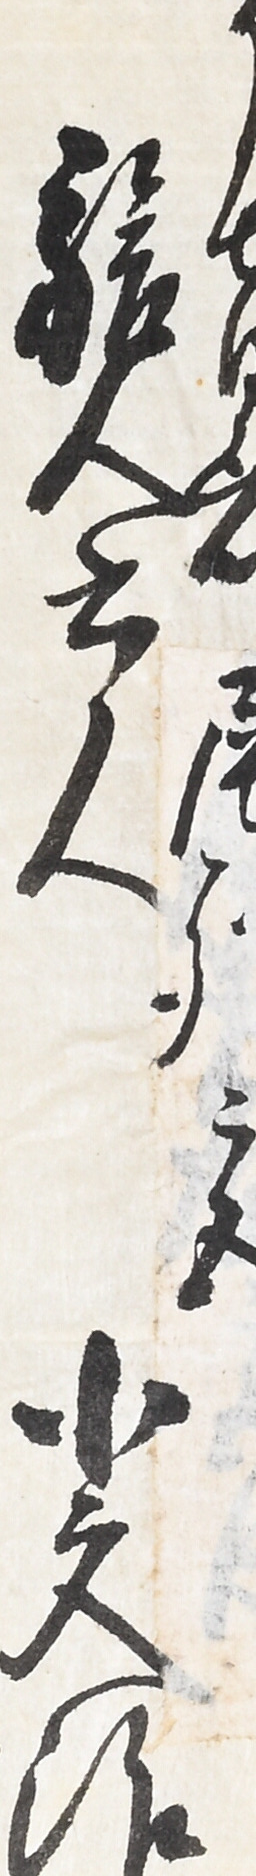一旅人六人小文治
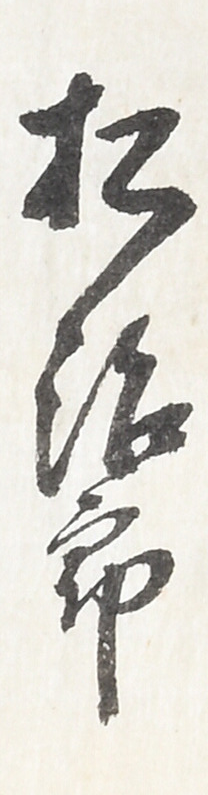松治郎
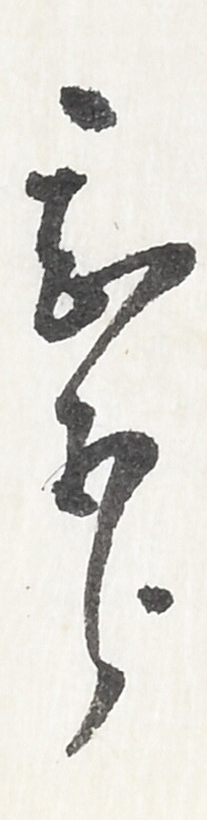甚五郎
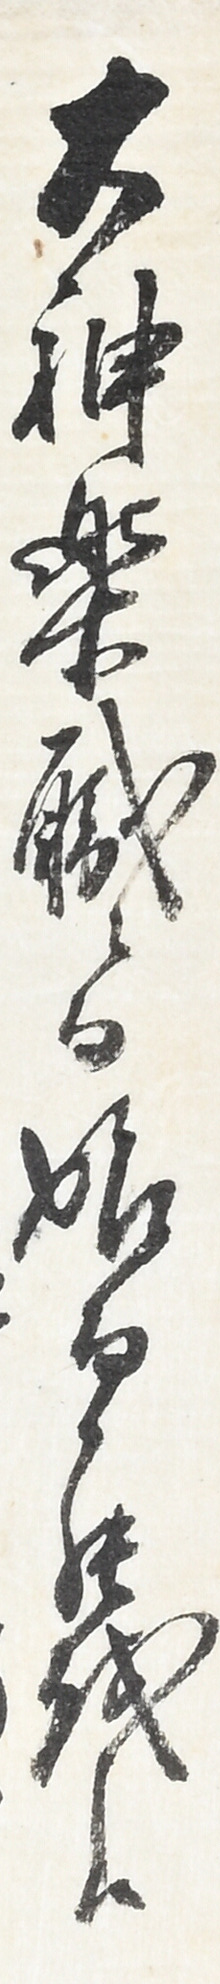大神楽職ニ而始而罷越申候
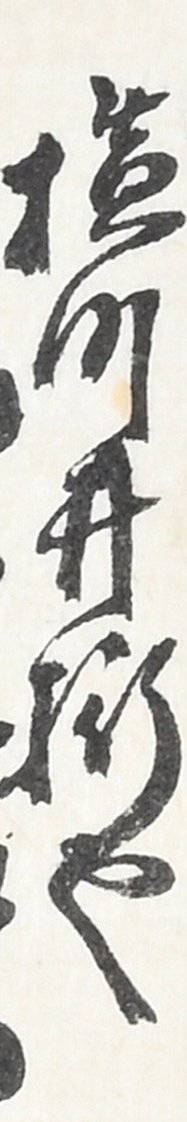横川井桁や
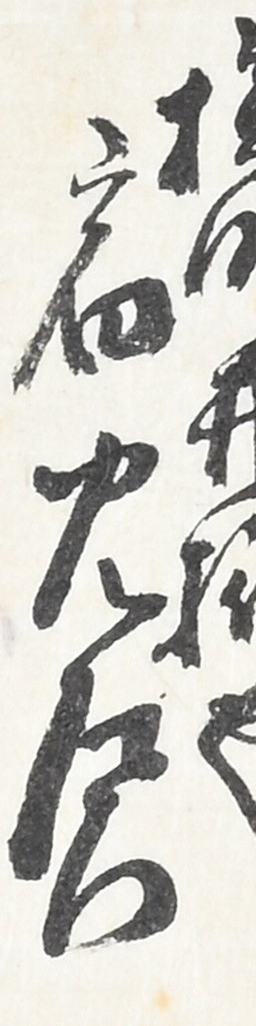宿忠左衛門
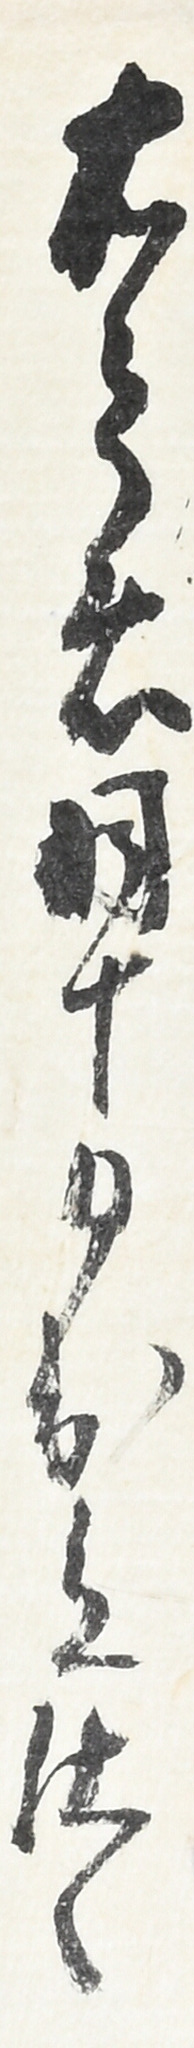右之者同十日出立仕候
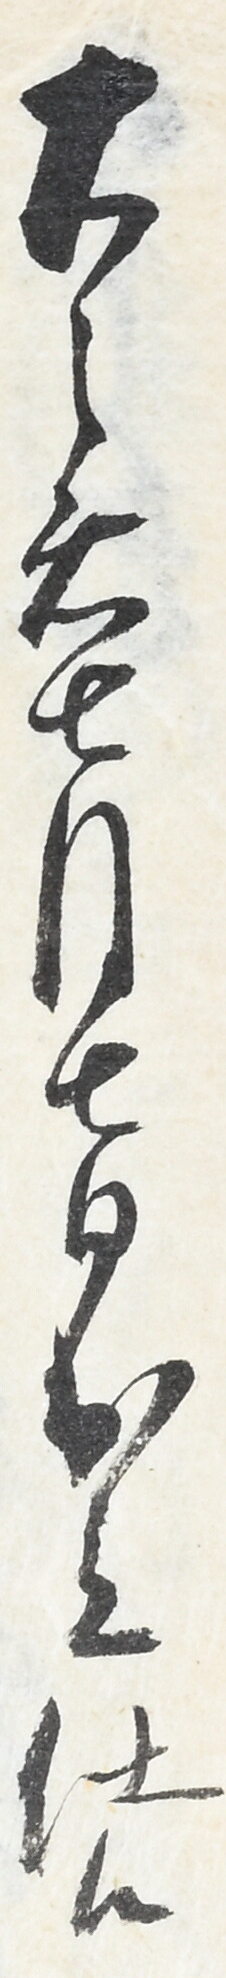右之者七月二日出立仕候
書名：旅人泊控帳
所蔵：伊那市立高遠町図書館・合同会社AMANE
